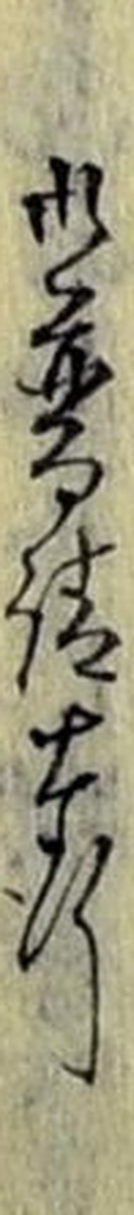御普請奉行
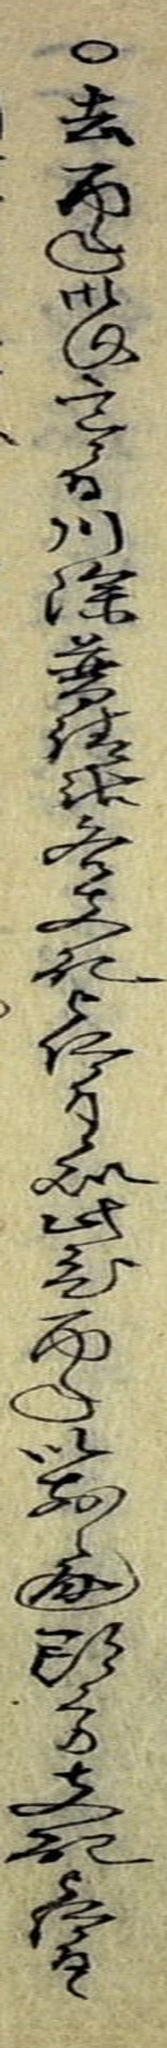○去酉年御趣意ニ付川除普請銀各支配被仰付候処此度酉年以前之通郡方支配被仰付候
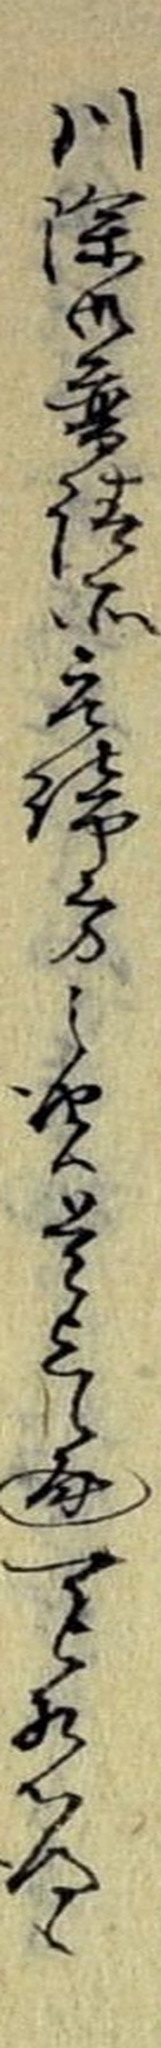川除御普請所取締方之儀ハ是迄之通可被相心得候
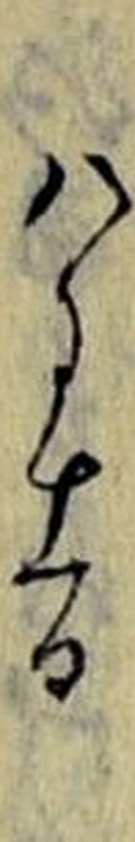八月十一日
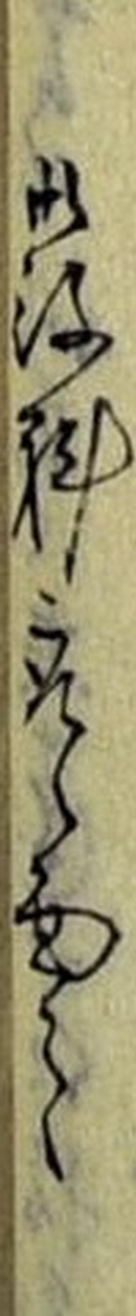御役料取之面々へ
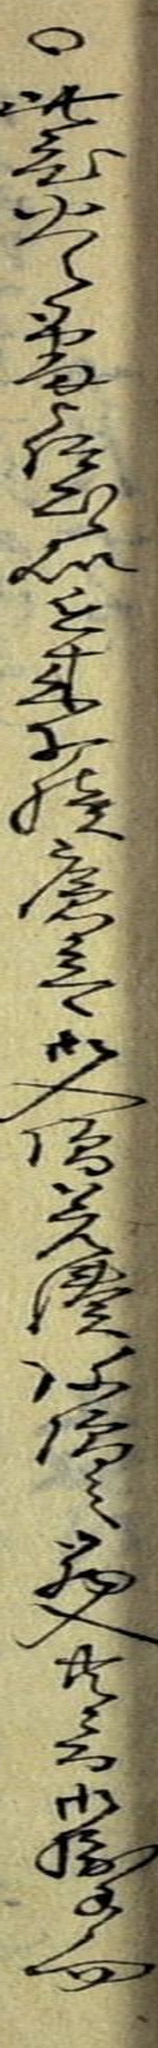○此度火之御番被仰出候処近来打続廉立候御入増差湊弥増之御物入共ニ而御勝手向
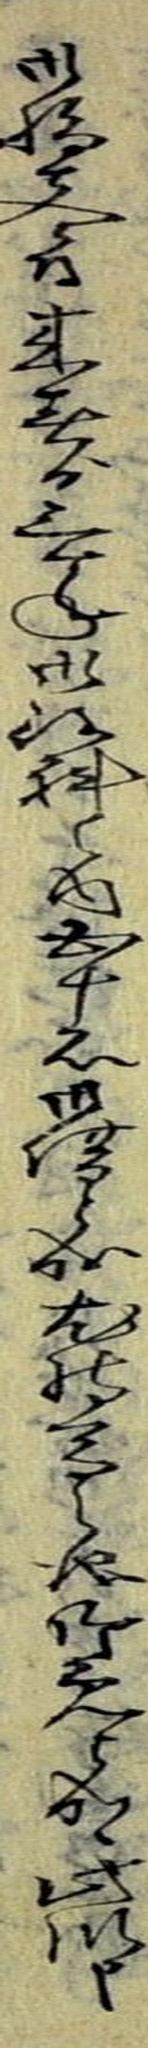御指支ニ付来春ゟ三ケ御役料之内五十石御借被成尤持高之儀御免被成候此段申
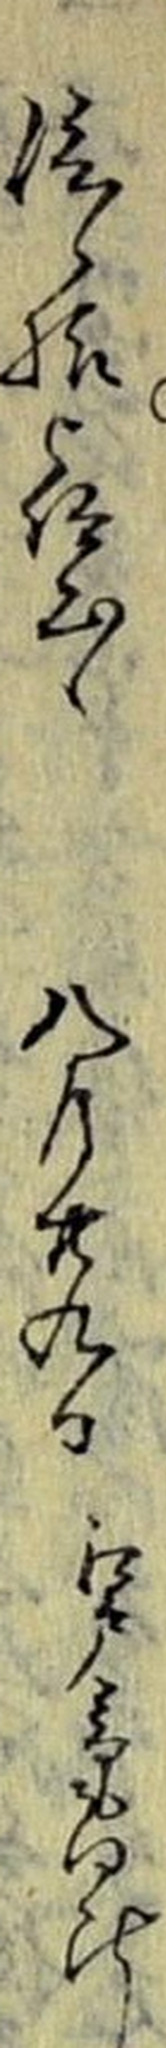渡候様被仰出候八月廿九日江戸ニ而も同断
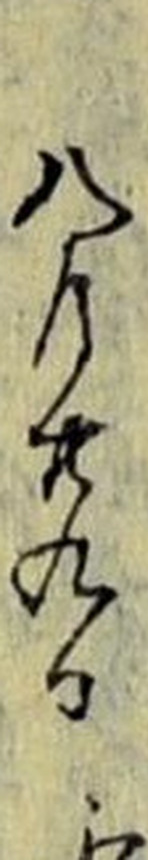四月廿五日
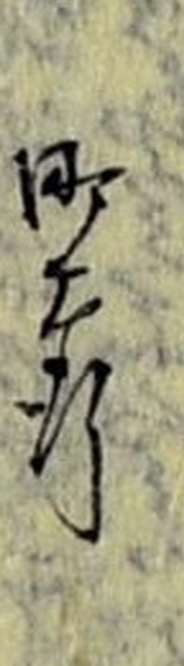御奉行
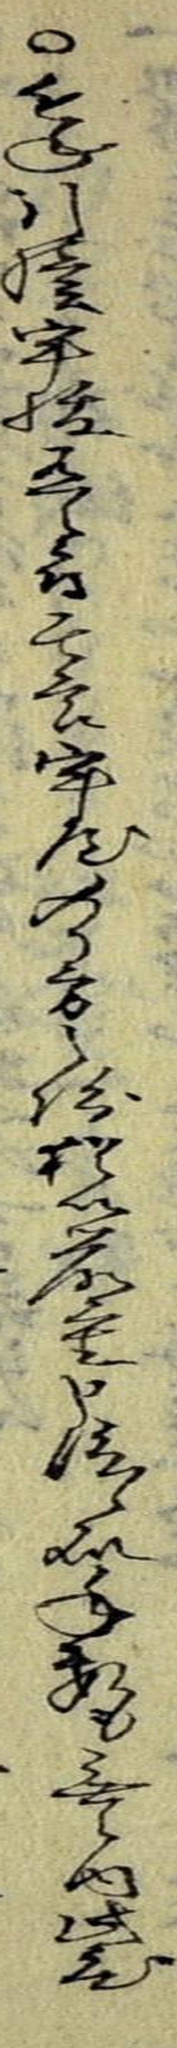○近年引続牢抜有之ニ付其節牢屋〆り方之儀猶以厳重申渡候処年数も無之内此度
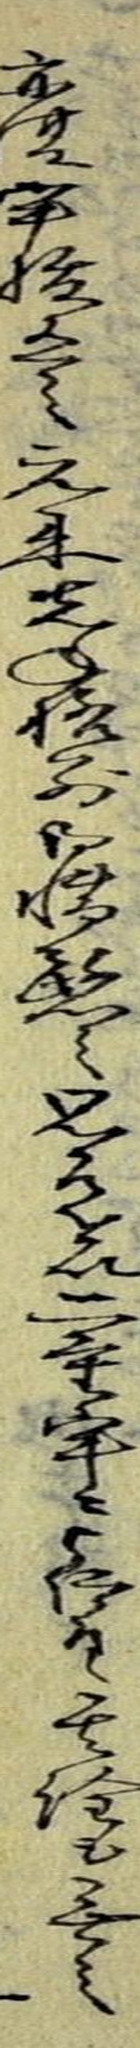亦復牢抜有之元来先年格別御隣愍之思召を以二重牢ニ被仰付候其詮も無之
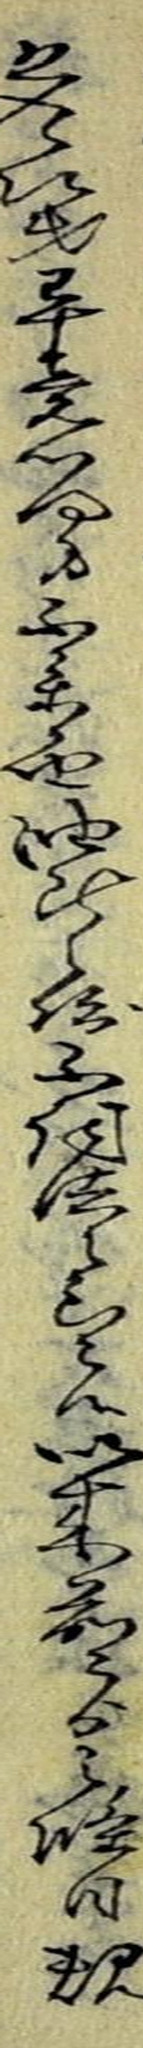恐入候次第畢竟心得方不参届之由油断之儀不調法之至ニ候以来前々ゟ之条目規
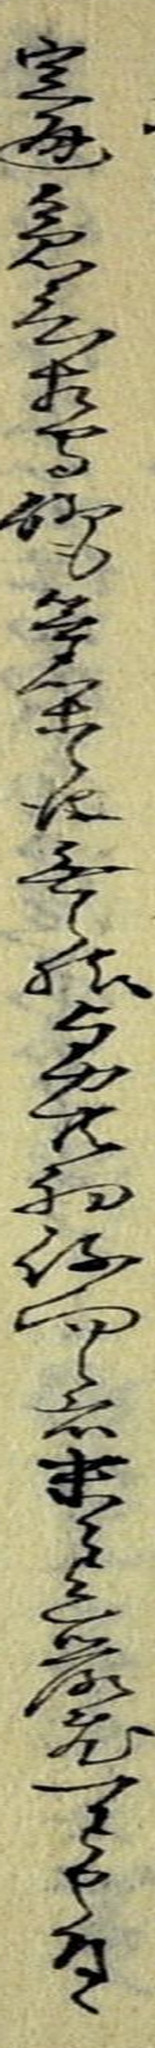定通急度相守聊も等閑之儀無之様与力共初役向之者末々迄厳敷可被申付候
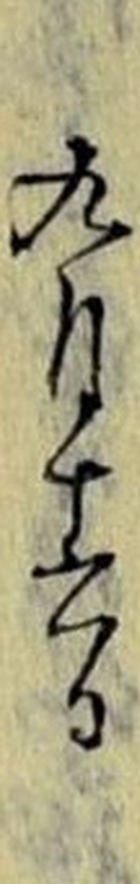九月十六日
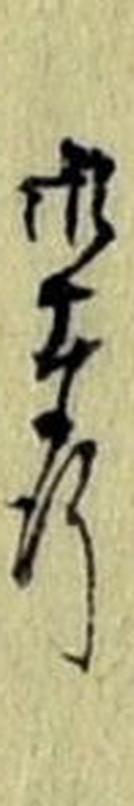御奉行
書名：命令之部 五
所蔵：福井県文書館 Fukui Prefectural Archives
